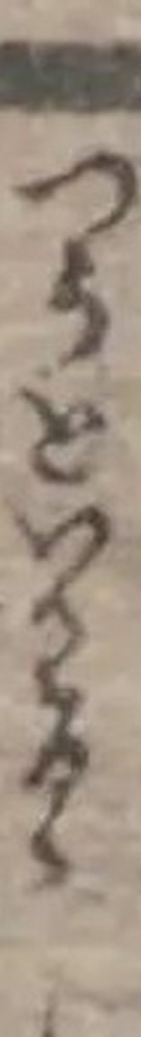つうといわるゝ
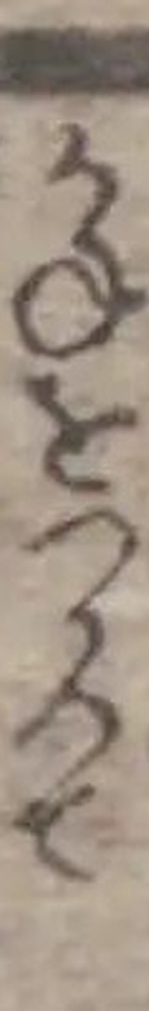かねをつかつて
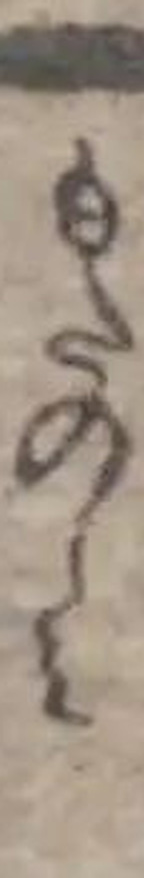もたのしみ
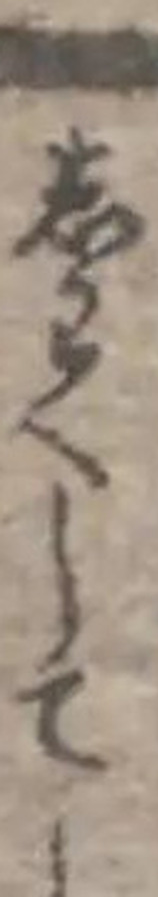しわへして
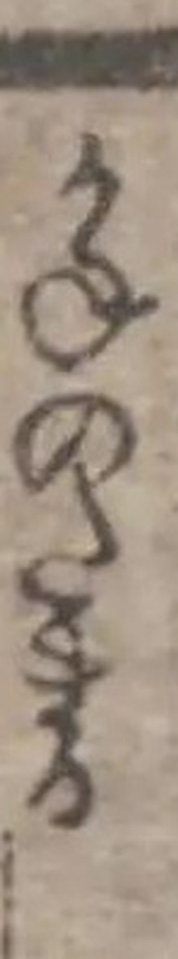かねのたまる
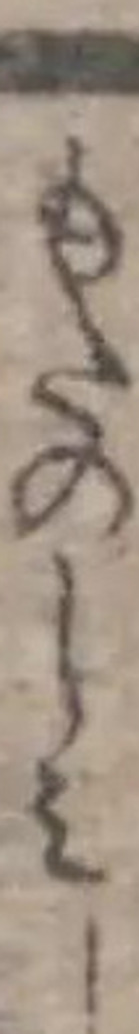もたのしみ
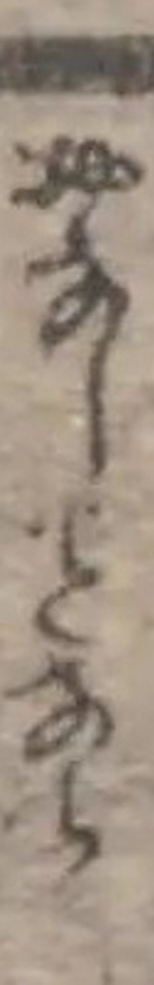おなしことなら
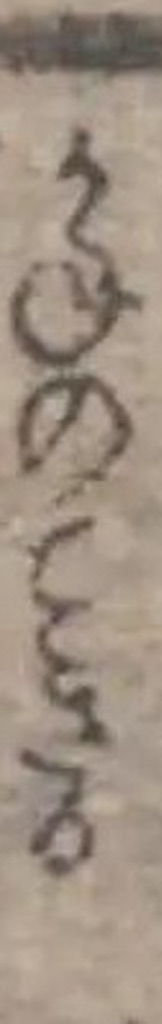かねのてきる
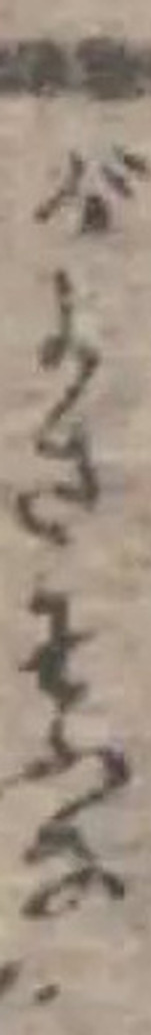がよさそふな
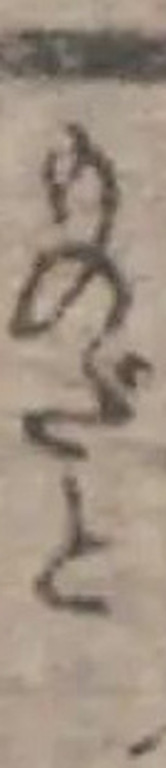ものだと
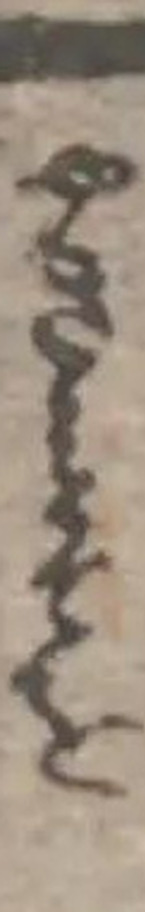やきみそを
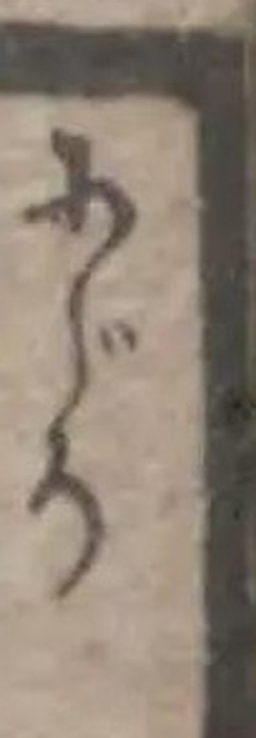にじう
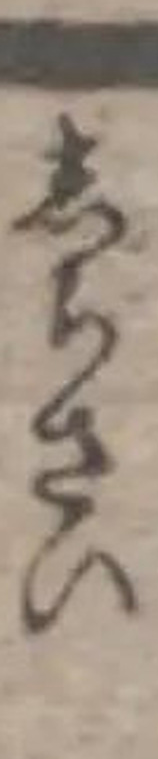しちさい
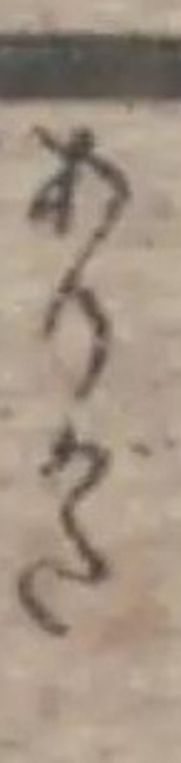ありがた
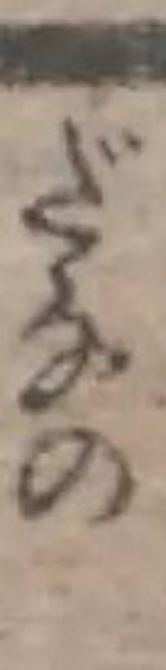だなの
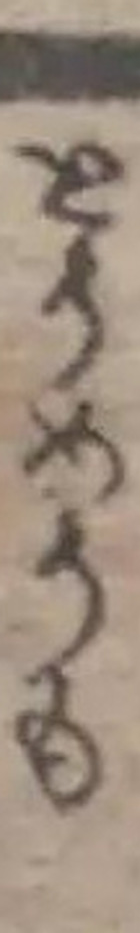とうめうも
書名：富多高慢噺 3巻
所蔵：国立国会図書館 National Diet Library, JAPAN
